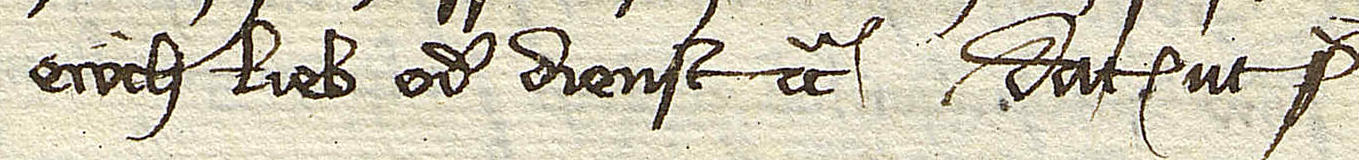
ewch lieb od* dienſt ec* / Dat* ut ſ*
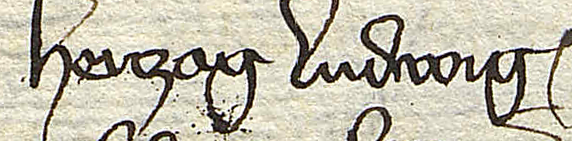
Hercʒog Ludwig*
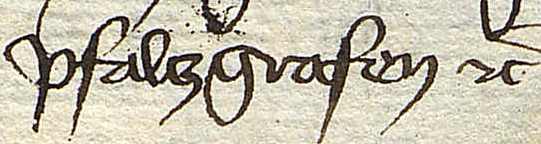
pfalcʒgrafen ec*
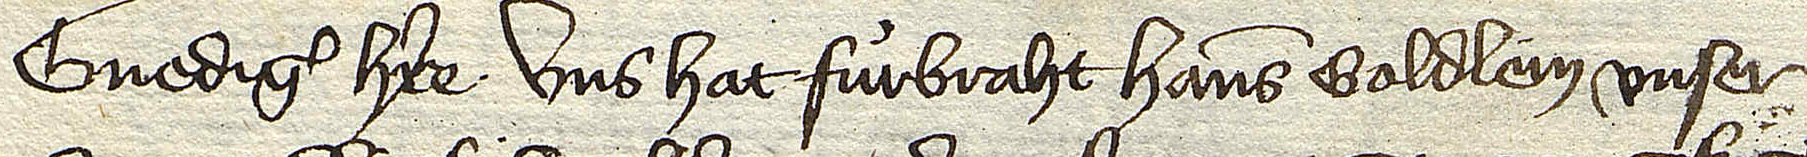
Gnedig* h*re . Vns hat fürbraht hans* Goldlein vnſer
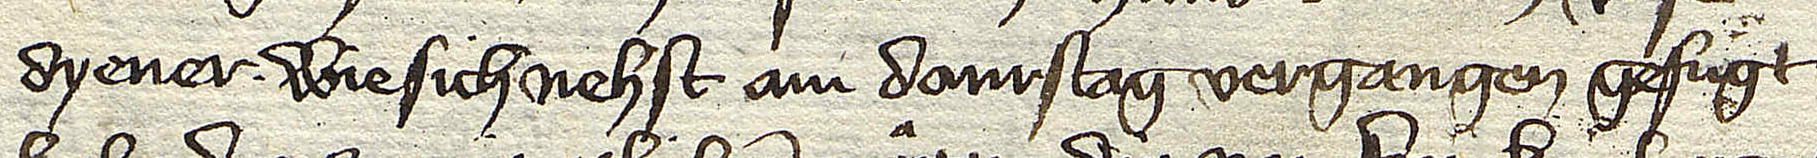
dyener . wie ſich nehſt am donrſtag vergangen gefügt
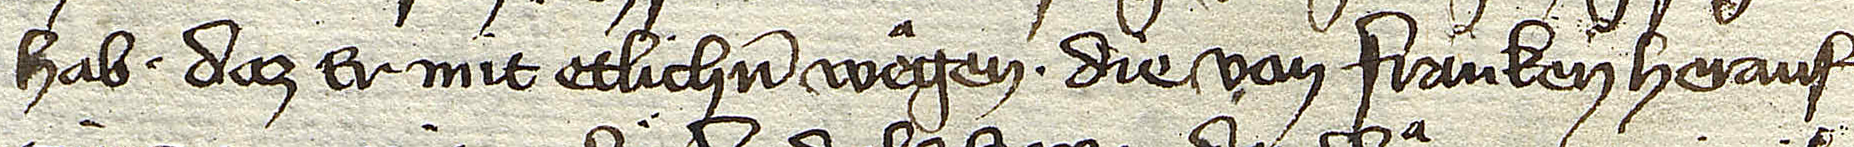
hab . daʒ Er mit etlich*n wëgen . die von Franken herauf
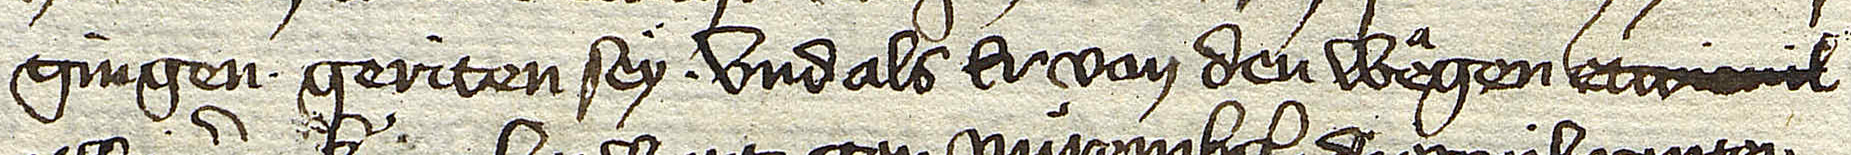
gingen . geriten ſey . Vnd als Er von den wëgen etwieuil
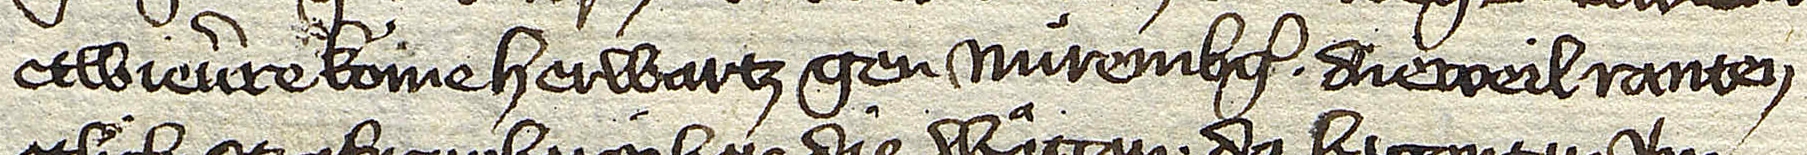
etwieu*re köme herwarcʒ gen Nüremb*g . dieweil ranten
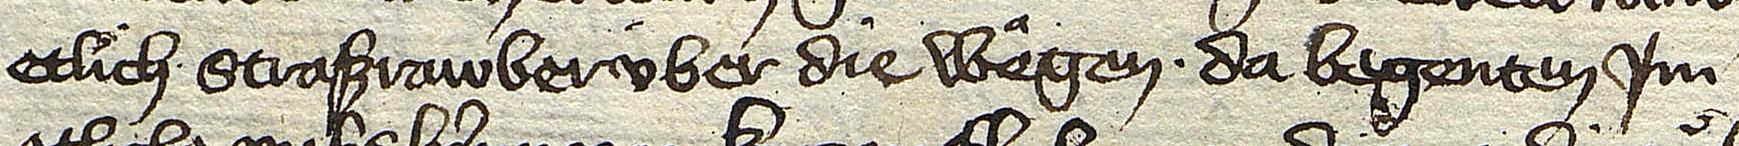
etlich . Straſʒrawber v̈ber die wëgen . da begenten Im
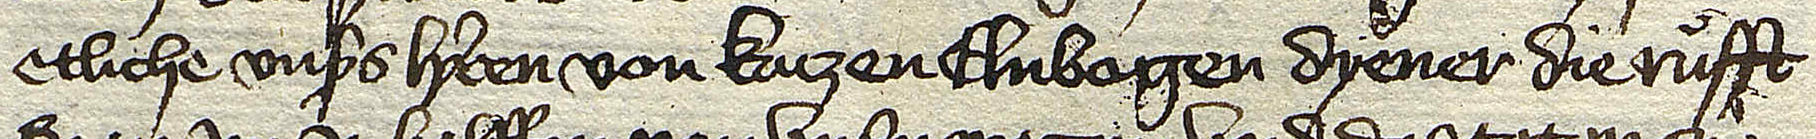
etliche vnſ*s h*ren von kacʒen Elnbogen dyener die rüfft
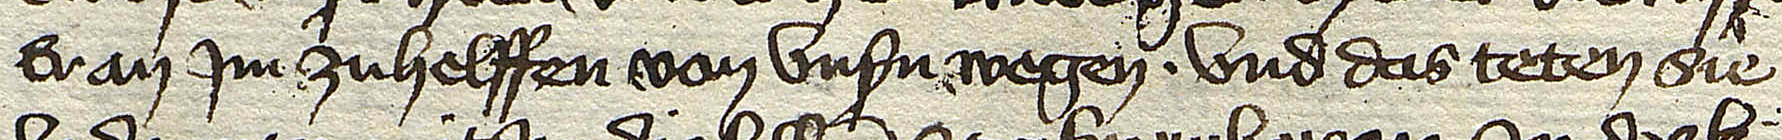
Er an Im ʒuhelffen von vnſ*n wegen . Vnd das teten Sie
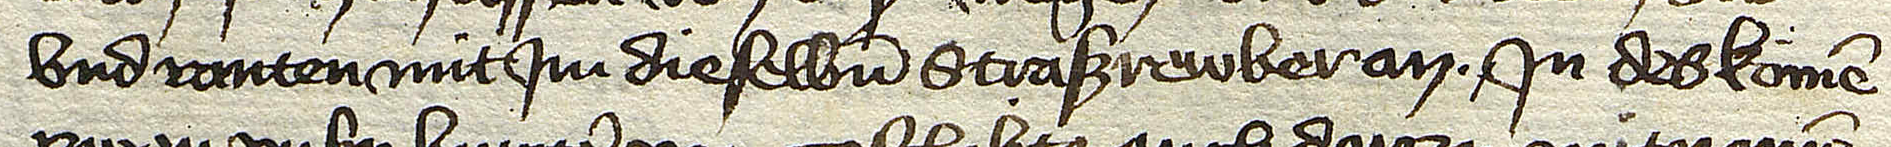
vnd ranten mit Im dieſelb*n Straſʒrewber an. In des köme*
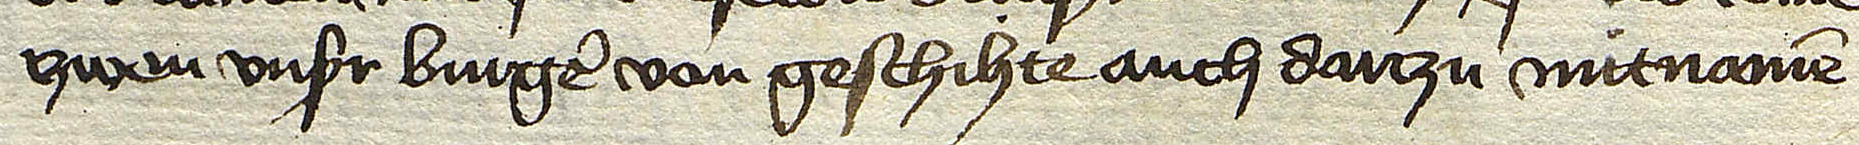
cʒwen vnſ*r burge* von geſchihte auch darcʒu mitname*
